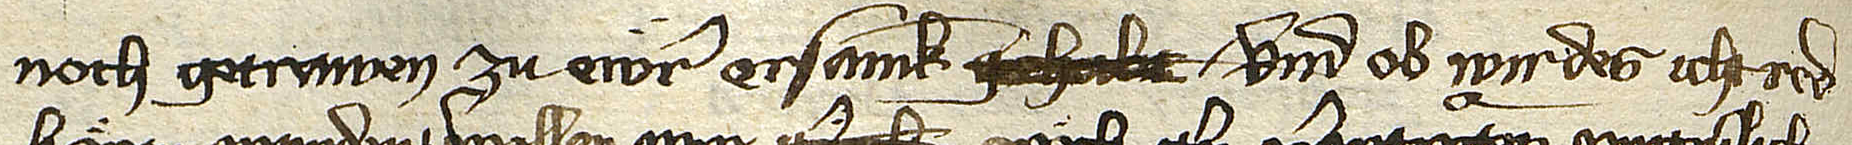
noch getrawen ʒu ewr* erſamk* gehabe / Vnd ob wir des icht red
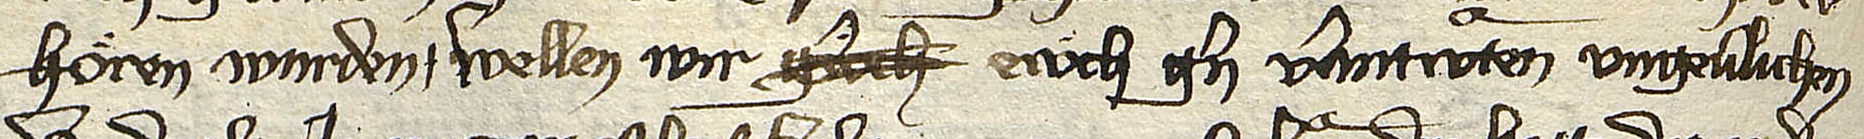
hören wurden / Wellen wir gwch* ewch g*n v*antwten* vngeulichen*
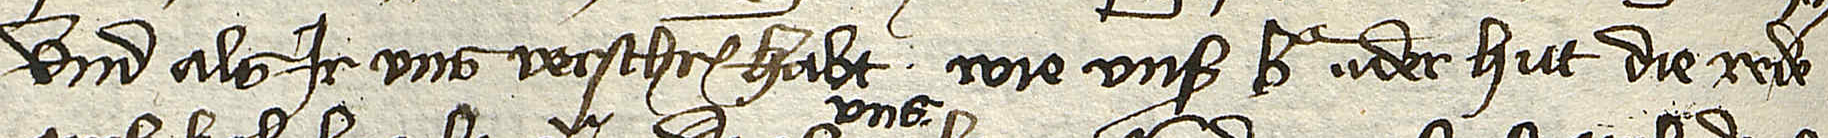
Vnd als Ir vns verſchr* habt . wie vnſ* b* ~ der hut die red
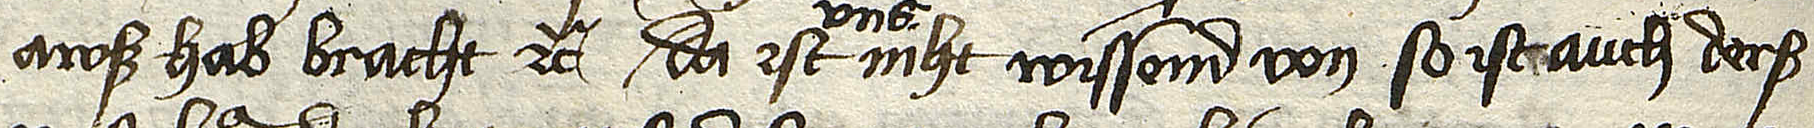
awſʒ hab bracht ec* / Da iſt niht wiſſend von ſo iſt auch derſ*
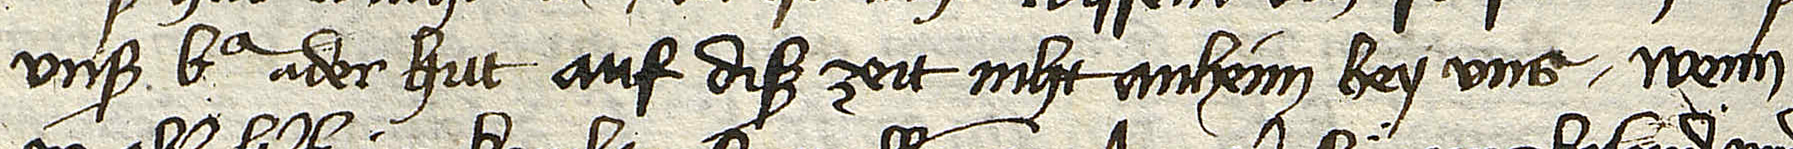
vnſ* b* ~ der hut auf diſ* ʒeit niht anheim bey vns / Wenn
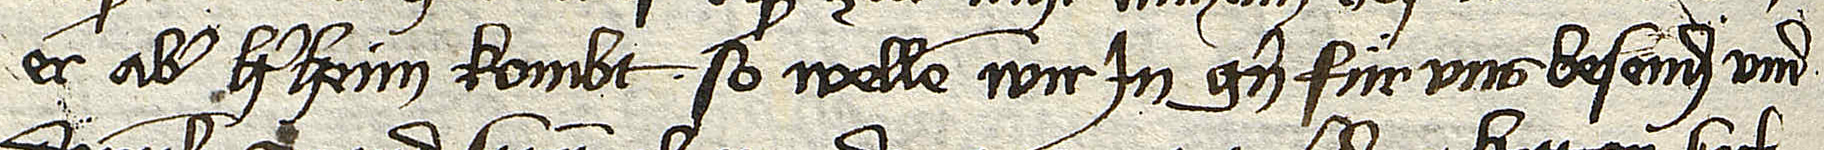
er ab* h*heim kombt . ſo welle* wir In gn* für vns beſend* vnd
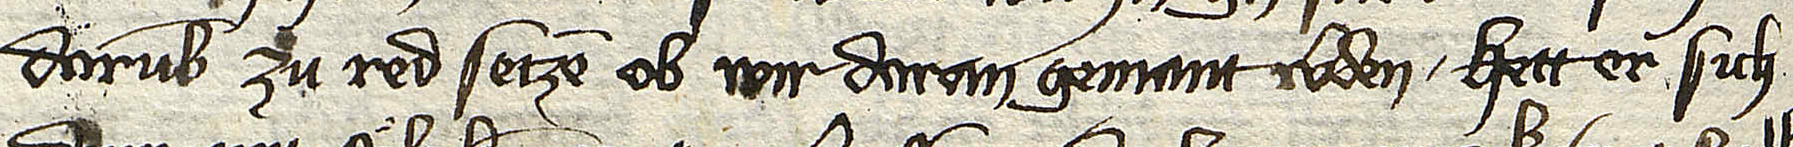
darub* ʒu red ſecʒe* ob wir daran gemant w*den / Hett er ſich
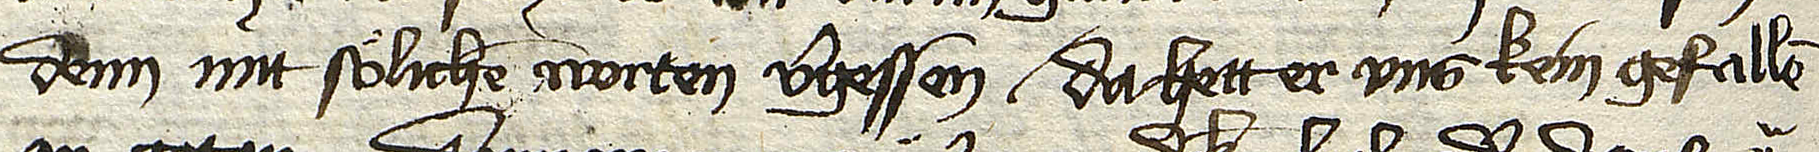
denn mit ſöliche* worten v*geſſen / Da hett er vns kein gefalle*
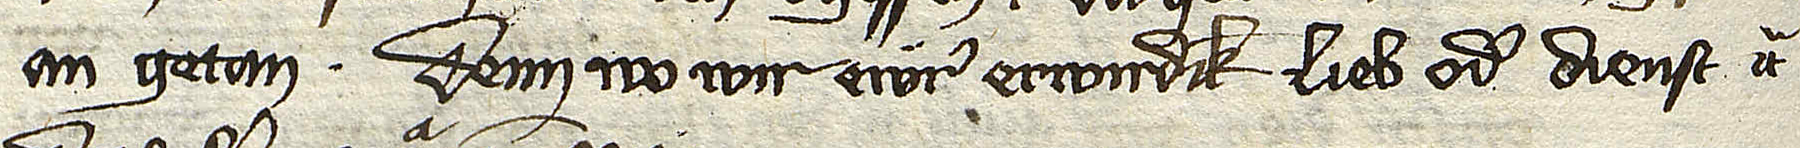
an getan . Denn wo wir ewr erwirdik* lieb od* dienſt ec*
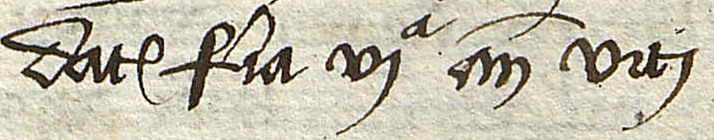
Dat* fia* vi* an* Viti
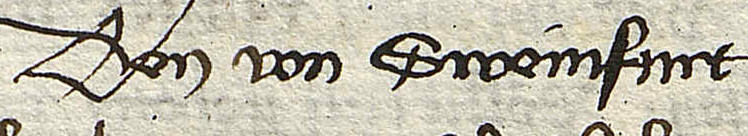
Den von Sweinfurt
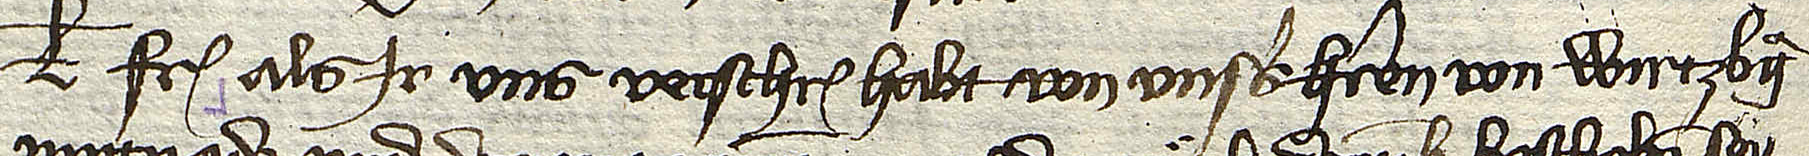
L* fr* als Ir vns verſchr* habt von vnſ*s h*ren von Wircʒb*g
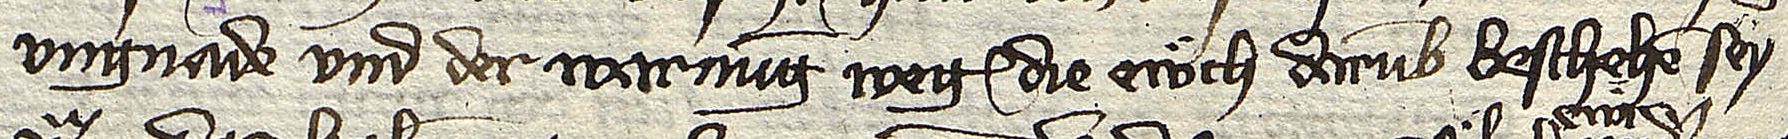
vngnade vnd der warnug* weg* die ewch darub* beſchehe* ſey
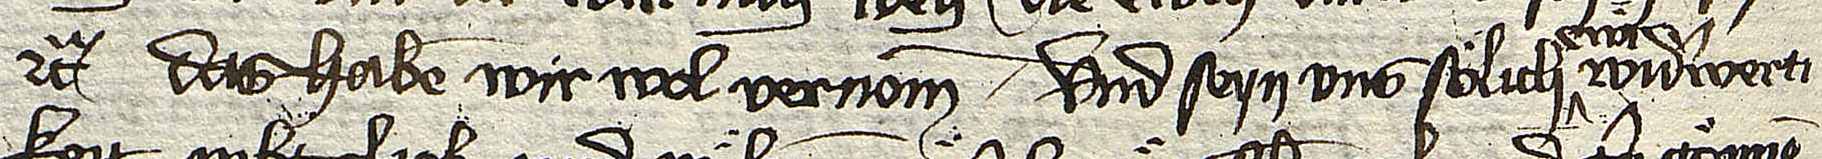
ec* Das habe* wir wol vernom* / Vnd ſeyn vns ſölich wid*werti
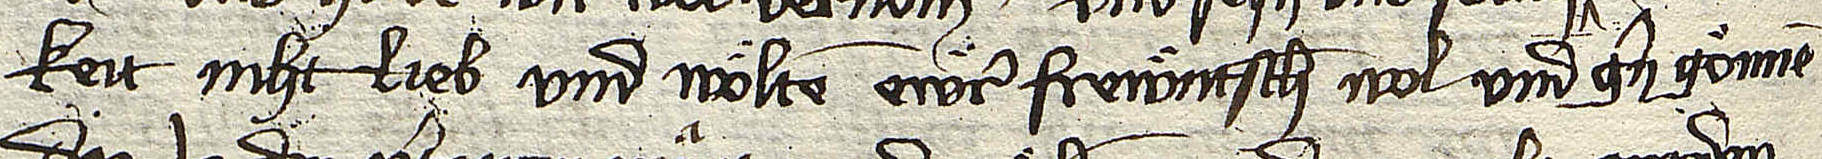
keit niht lieb vnd wölte* ewr* frewntſch* wol vnd gn* gönne*
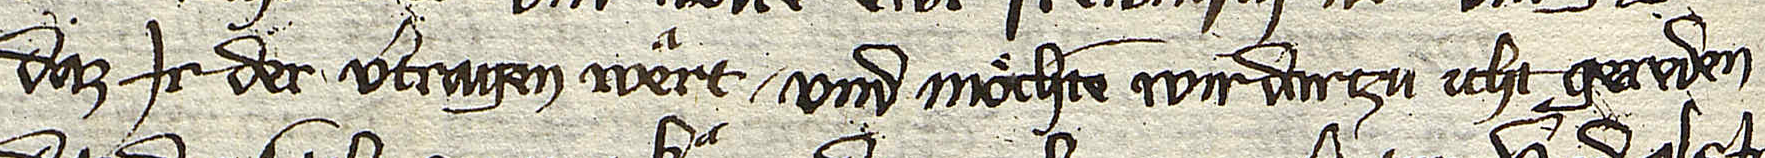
daʒ Ir der v*tragen wërt / vnd möchte* wir darcʒu icht gereden
